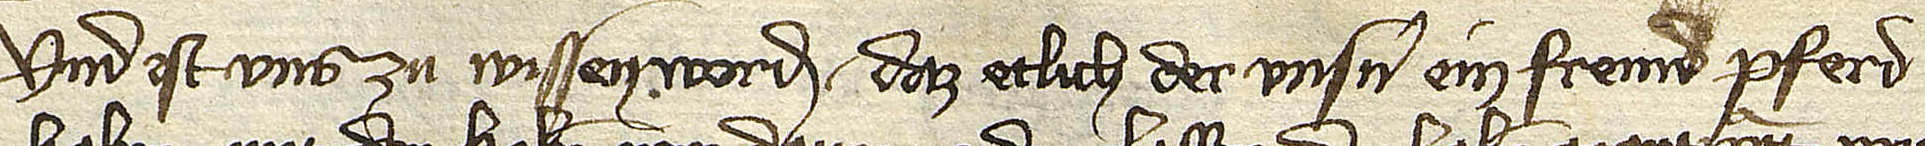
Vnd iſt vns ʒu wiſſen word* / daʒ etlich der vnſ*n ein fremd Pferd
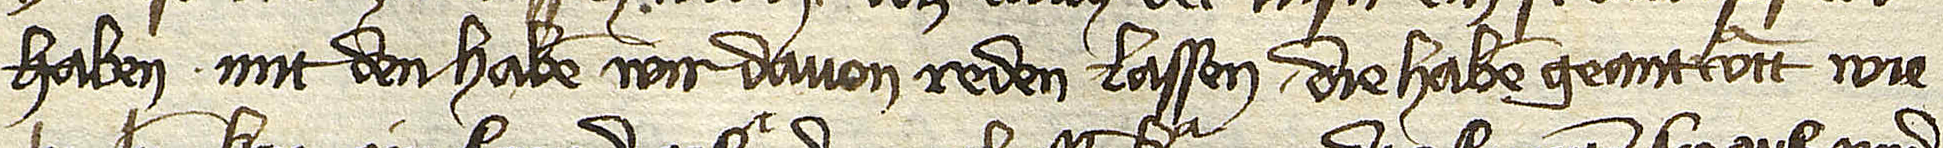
haben mit den habe* wir dauon reden laſſen / die habe* geantw*tt wie
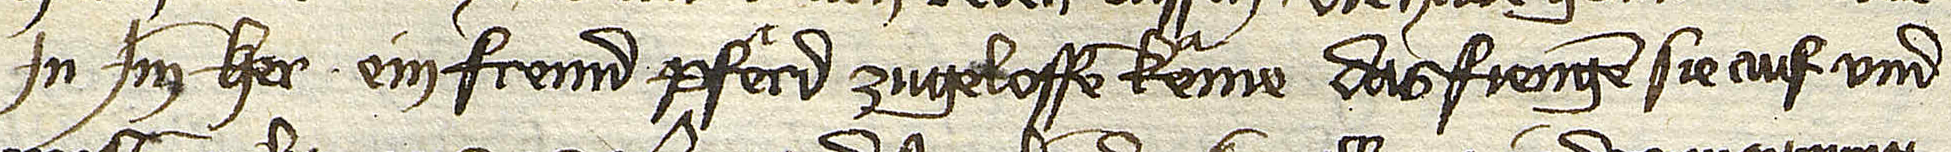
In Im* her . ein fremd Pfërd ʒugeloffe* këme das fienge* ſie auf vnd
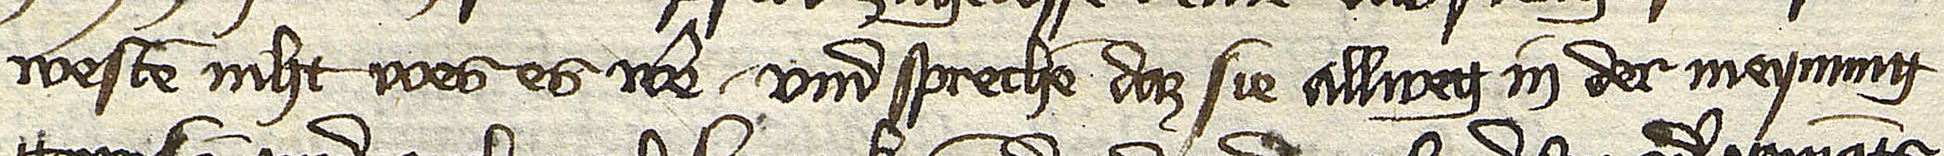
weſte* niht wes es we* / vnd ſpreche* daʒ ſie allweg in der meynung
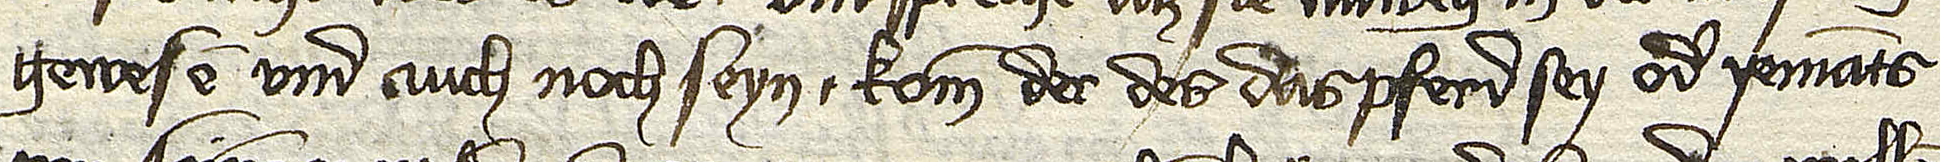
geweſe* vnd auch noch ſeyn . kom* der des das pferd ſey od* yema*ts
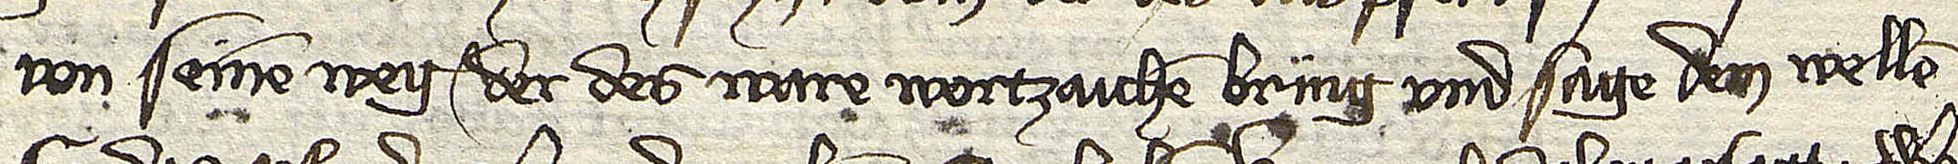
von ſeine* weg* der des ware wortʒaiche* bring vnd ſage dem welle*
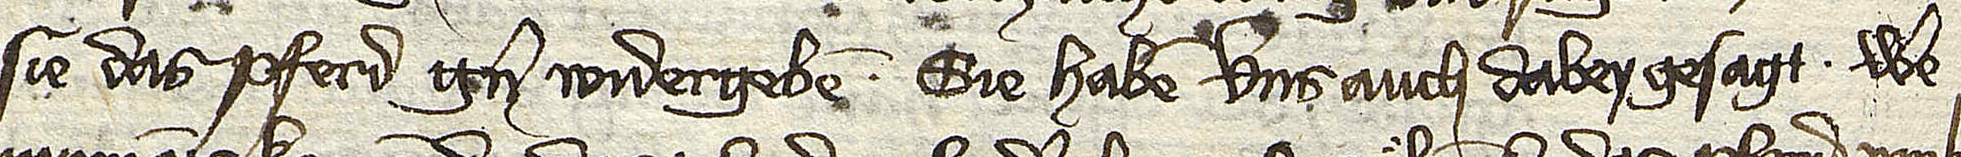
ſie das pferd g*n widergebe* . Sie habe* Vns auch dabey geſagt . w*e
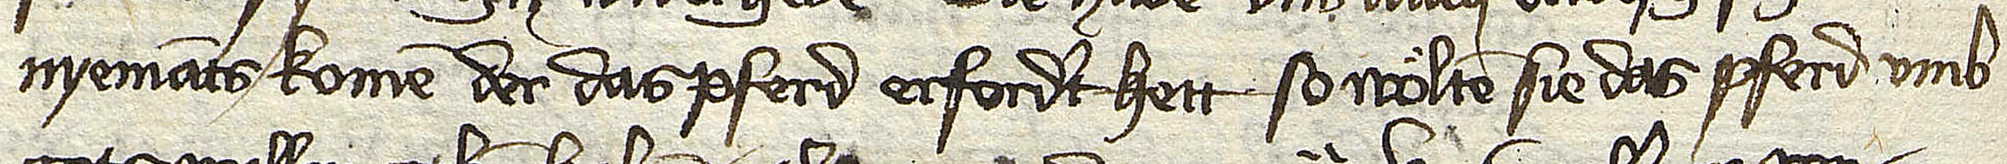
nyema*ts kome* der das Pferd erford*t hett . ſo wölte* ſie das pferd vmb
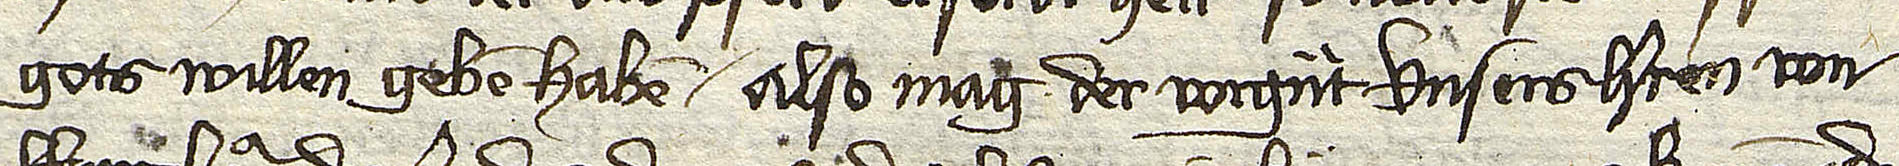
gots willen gebe* habe* / Alſo mag der vorgn*t Vnſers h*ren von
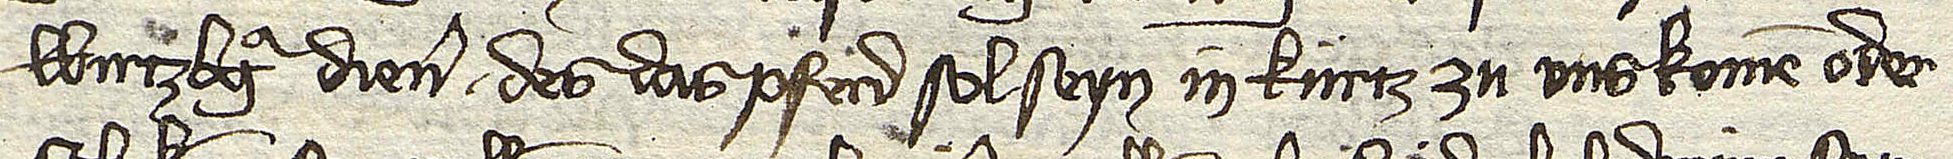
wircʒb*g dien* / des das pferd ſol ſeyn in kürcʒ ʒu vns kome* oder
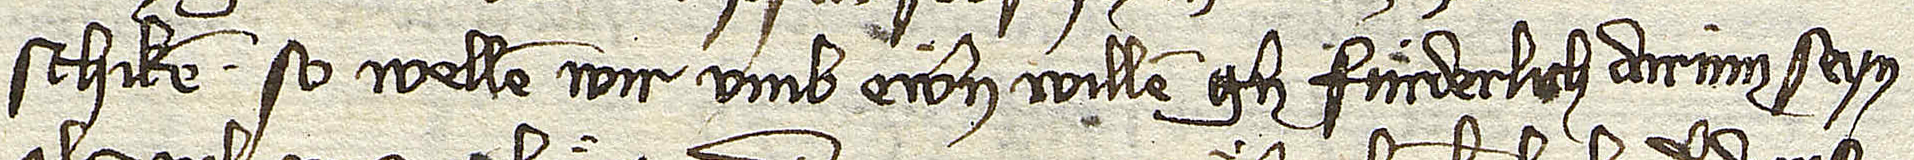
ſchike* . ſo welle* wir vmb ew*n wille* g*n fürderlich darinn ſeyn
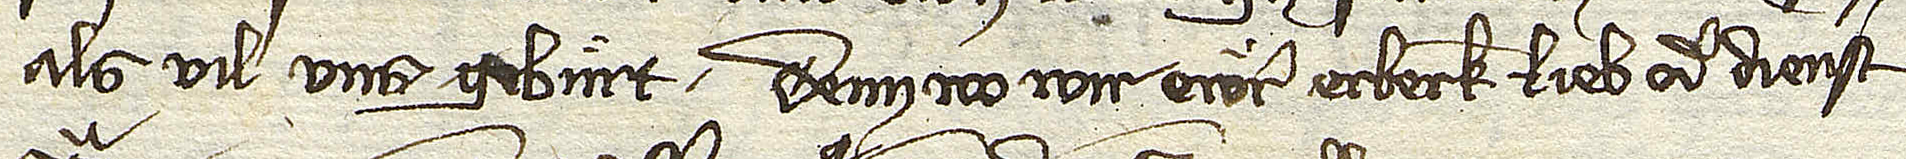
als vil vns gebürt / Denn wo wir ew*r erberk* lieb od* dienſt
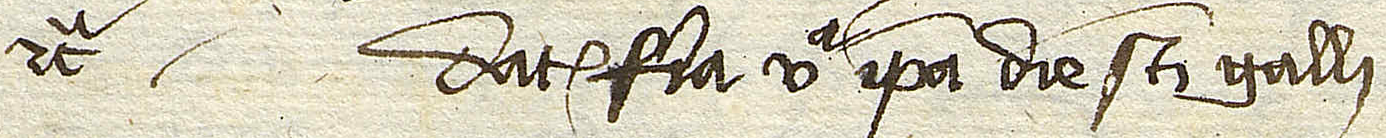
ec* / Dat* fia* ipa* die ſ*ti galli
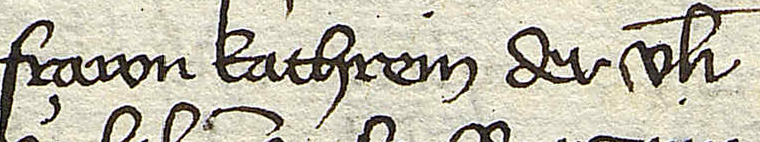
frawn kathrein der vlr*
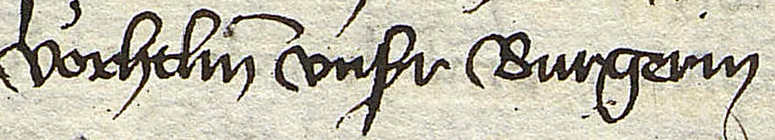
Vörhtlin* vnſ*r Burgerin
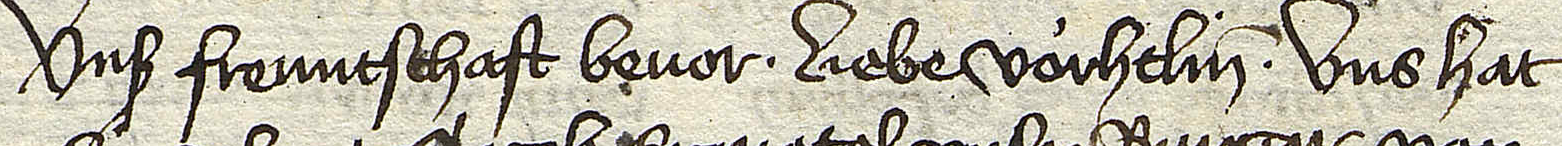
Vnſ* freuntſchaft beuor . Liebe vörhtlin* . Vns hat
